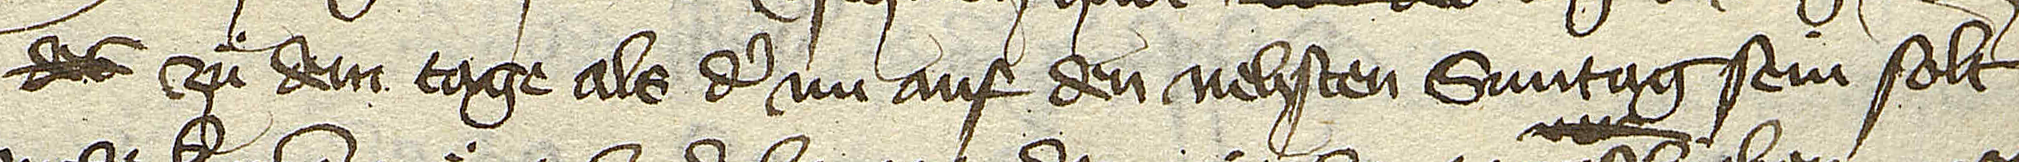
des cʒü dem tage als d* nu auf nehſten Suntag ſein ſolt
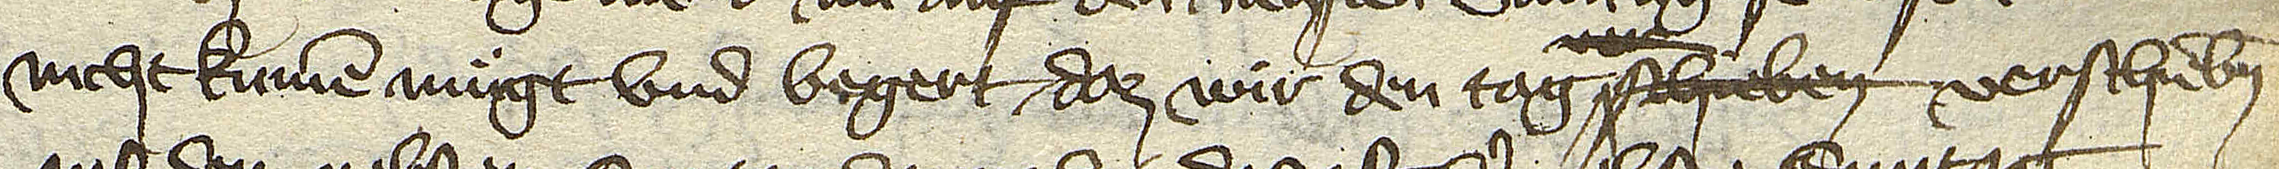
nicht kume* mügt vnd begert / daʒ wir den tag ſchieben verſchiebn*
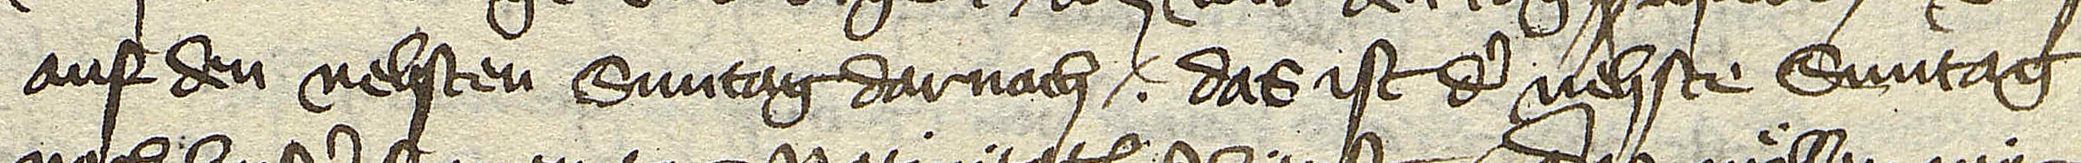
auf den nehſten Suntag darnach / . das iſt d* nehſte Suntag
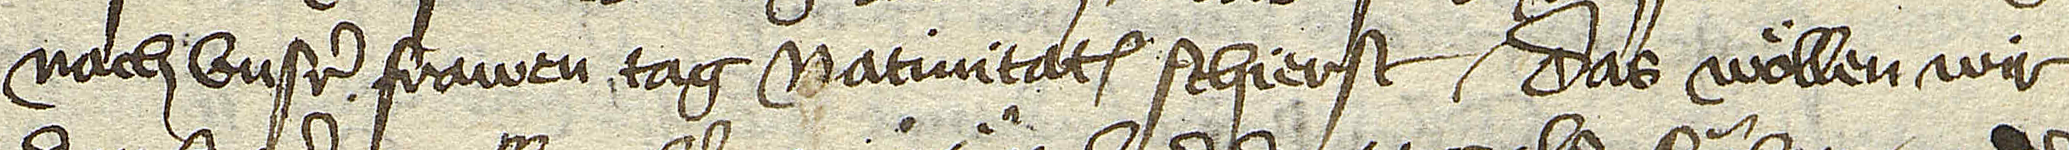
nach vnſr* frawen tag Natiuitat* ſchierſt / Das wöllen wir
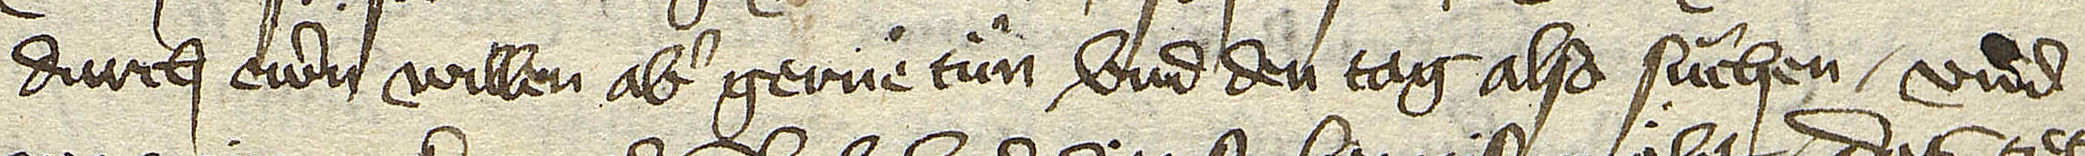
durch ew*n willen ab* gerne tün / vnd den tag alſo ſüchen / vnd
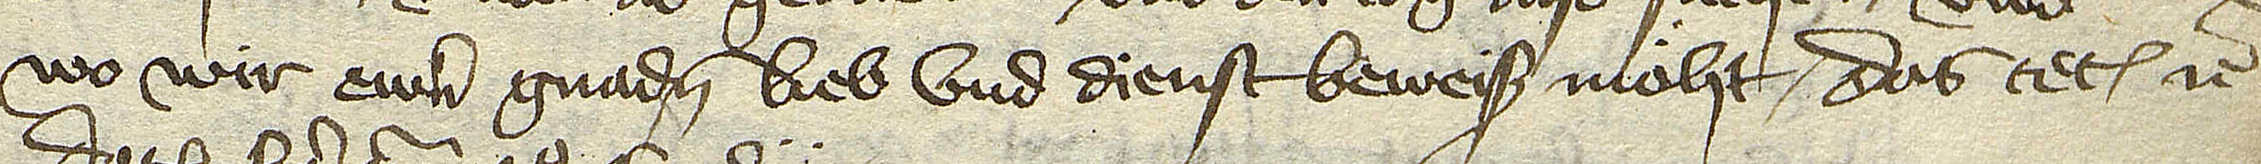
wo wir ewn* gnadn* lieb vnd dienſt beweiſ* möht / Das tet* ec*
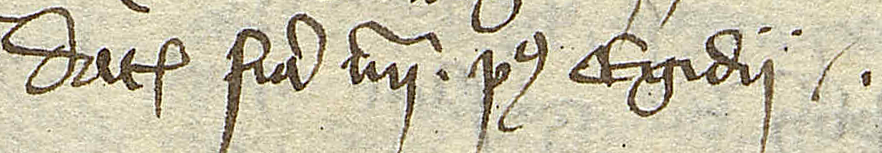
dat* fia* iiii* . p* Egidii / .
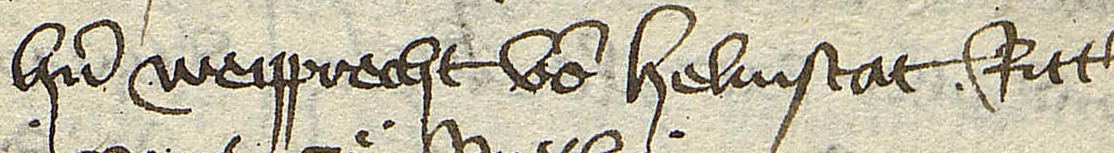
hn* weipprecht vo* Helmſtat . Ritt*
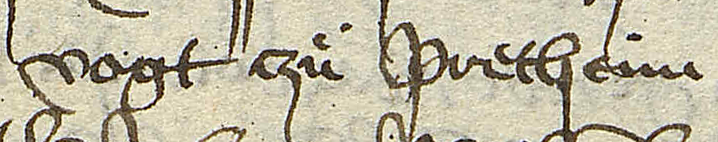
vogt cʒü Pretheim
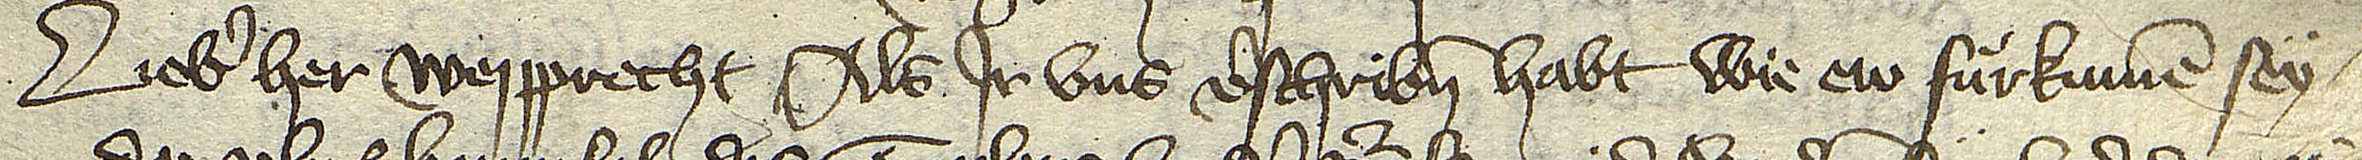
Lieb* her weipprecht / Als Ir vns v*ſchribn* habt wie ew fürkume* ſey /
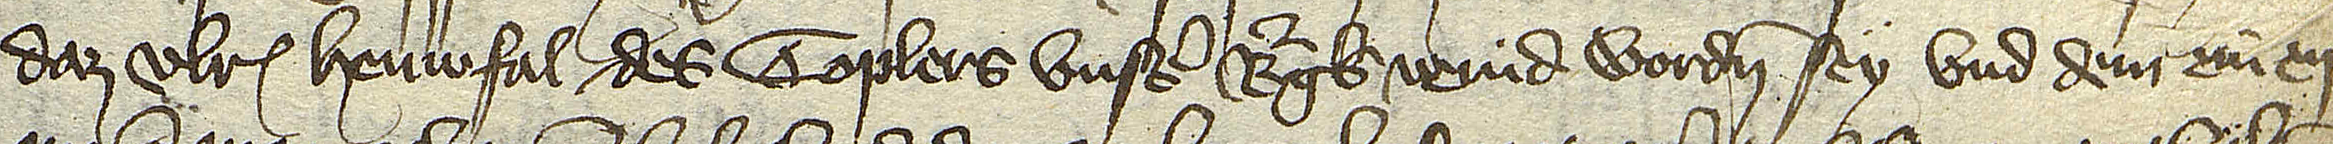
daʒ vlr* Heuwfal / des Toplers vnſs* B*g*s veind wordn* ſey vnd dem einen
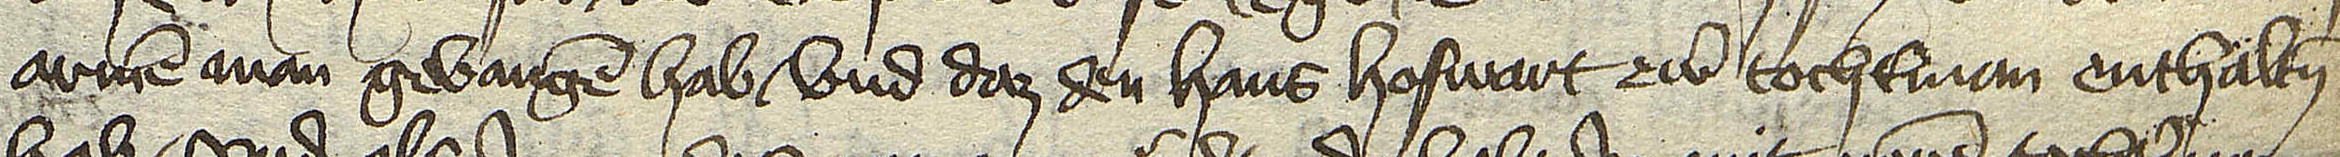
arme* man gevange* hab / vnd daʒ den hans hofwart ew* tocht*man enthaltn*
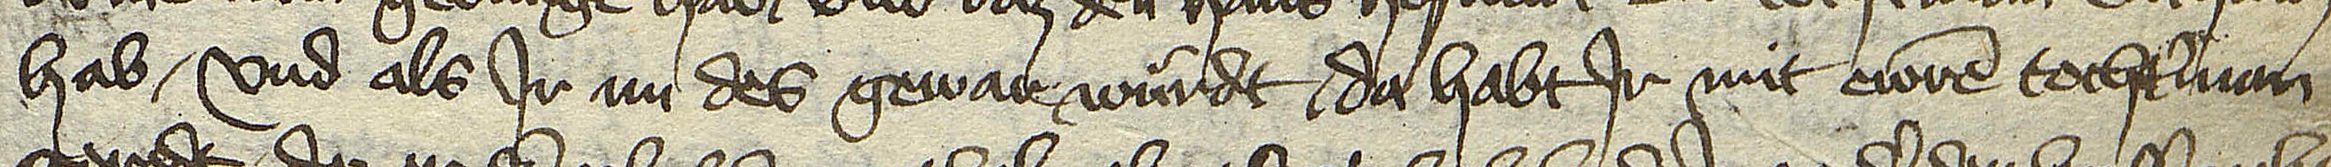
hab / vnd als Ir nu des gewar würdt / da habt Ir mit ewre* tocht*man
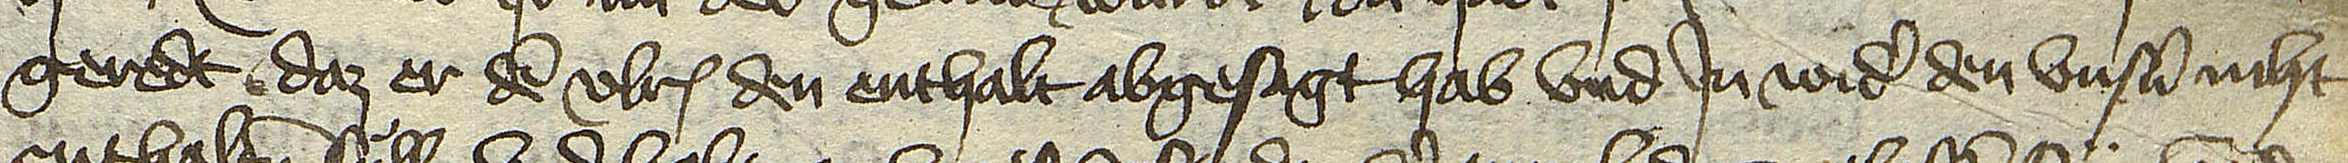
geredt / daʒ er d* vlr* den enthalt abgeſagt hab vnd In wid* den vnſn* niht
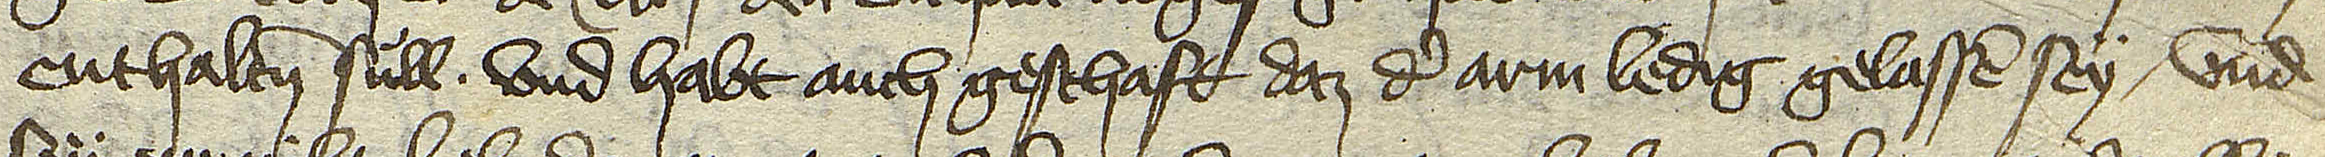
enthaltn* ſüll . vnd habt auch geſchaft daʒ d* arm ledig gelaſſe* ſey / vnd
